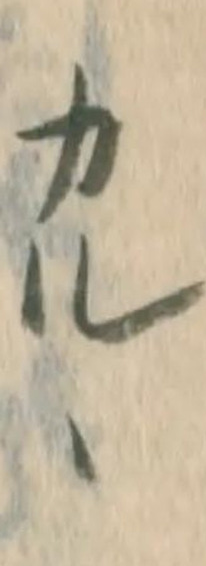カルヽ
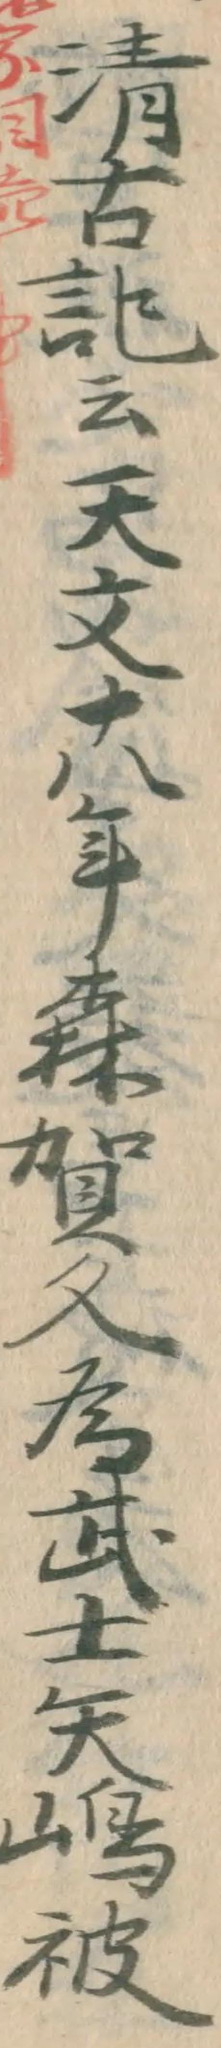清古記云天文十八年森賀久為武士矢嶋被
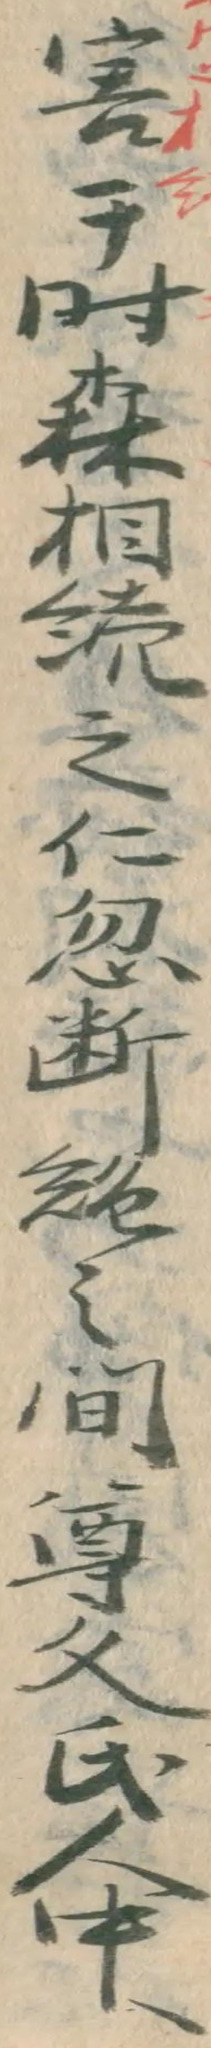害于時森相続之仁忽断絶之間尊久氏人中へ

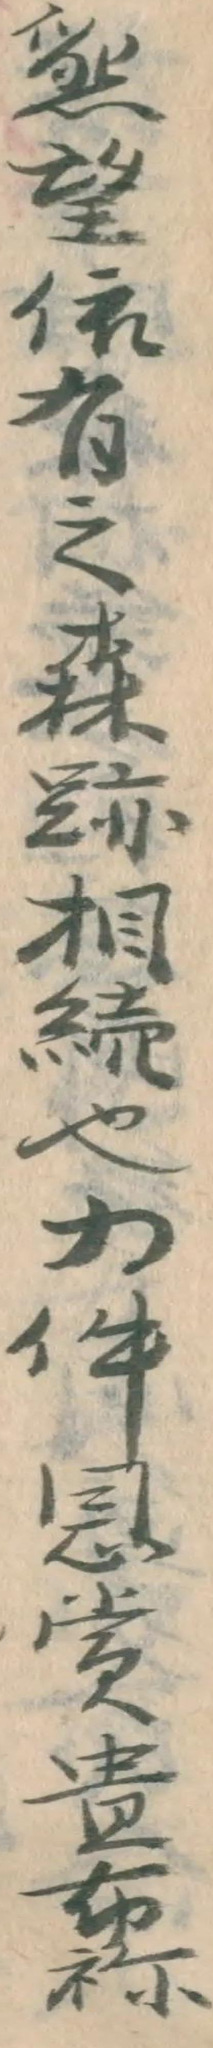懇望依有之森跡相続也為件恩賞貴ふね
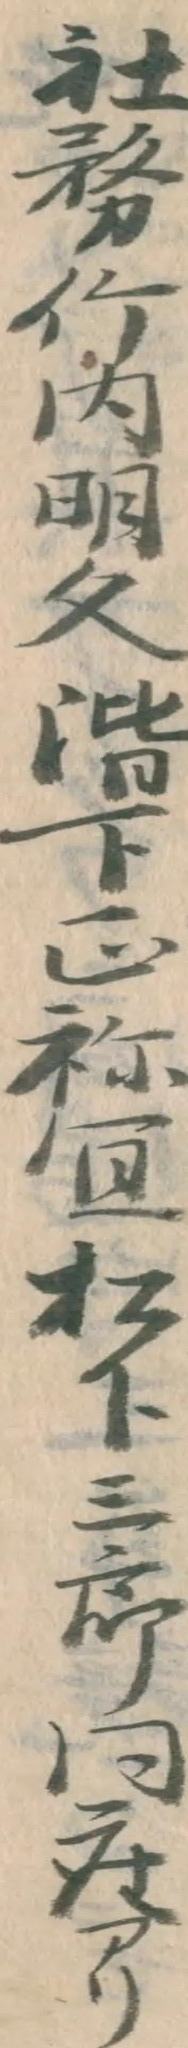社務竹内明久階下正祢宜松下三郎同座アリ
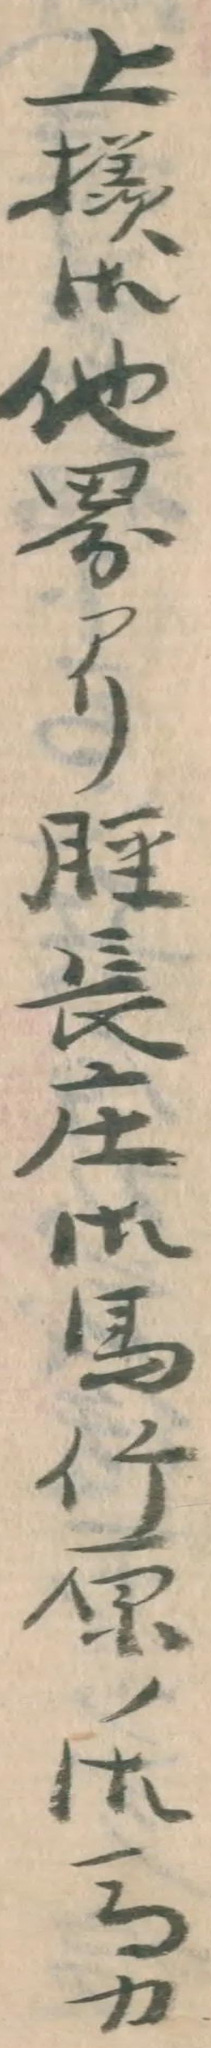上様御他界アリ脛長庄御馬竹原ノ御馬カ
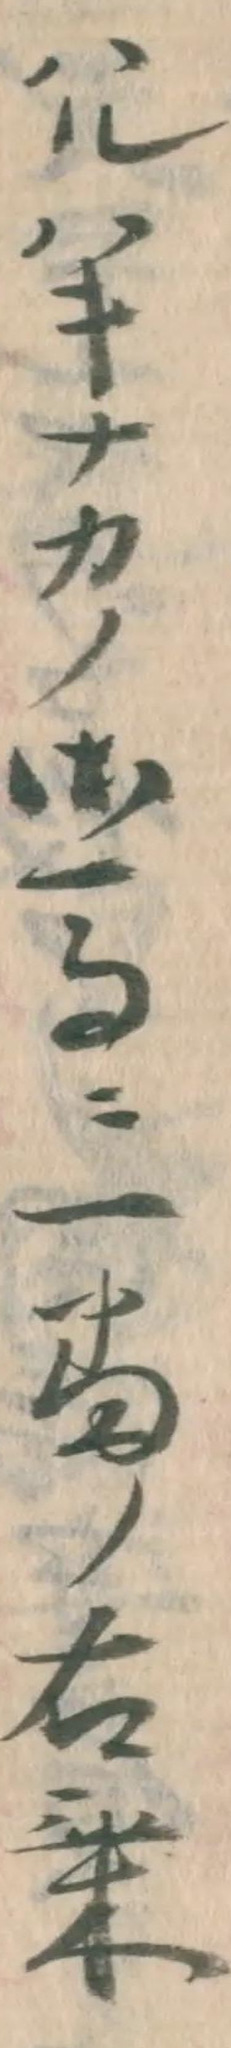ハルハキナカノ御馬ニ一番ノ右乗
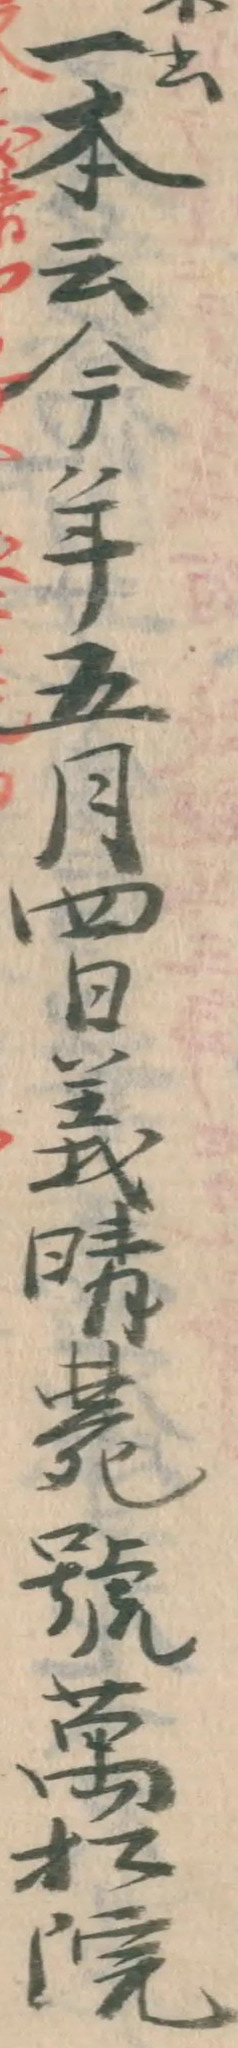一本云今年五月四日義晴薨号萬松院
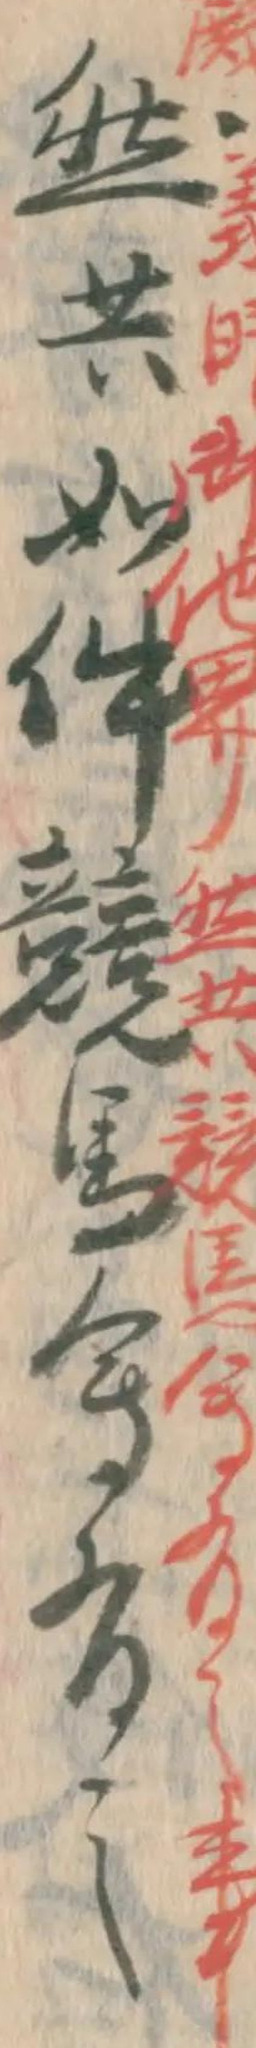然共如件競馬会有之
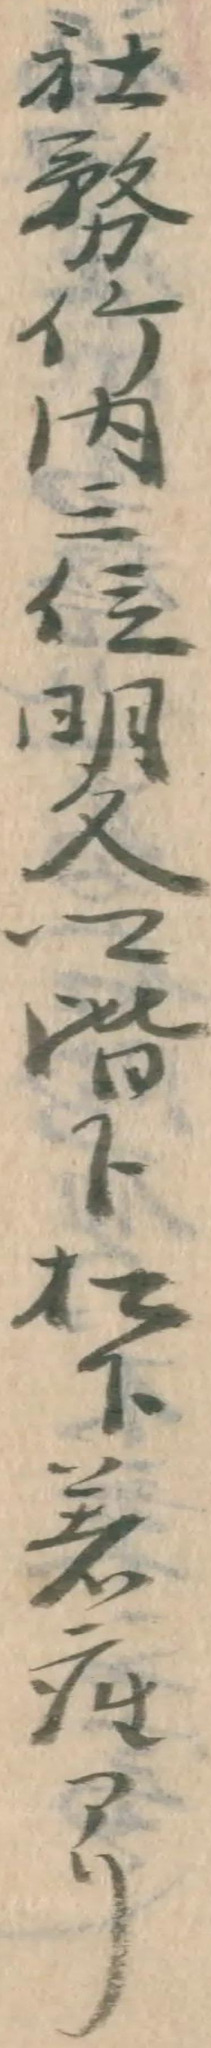社務竹内三位明久卿階下松下着座アリ
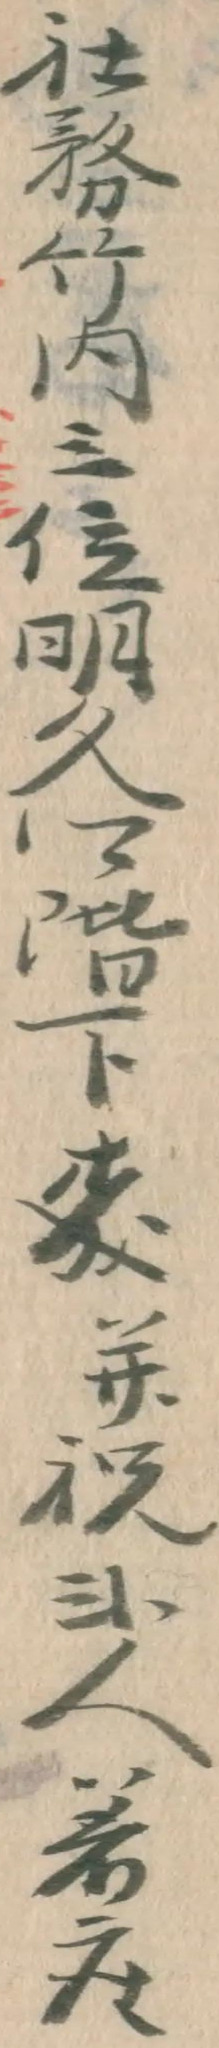社務竹内三位明久卿階下森并祝弐人着座
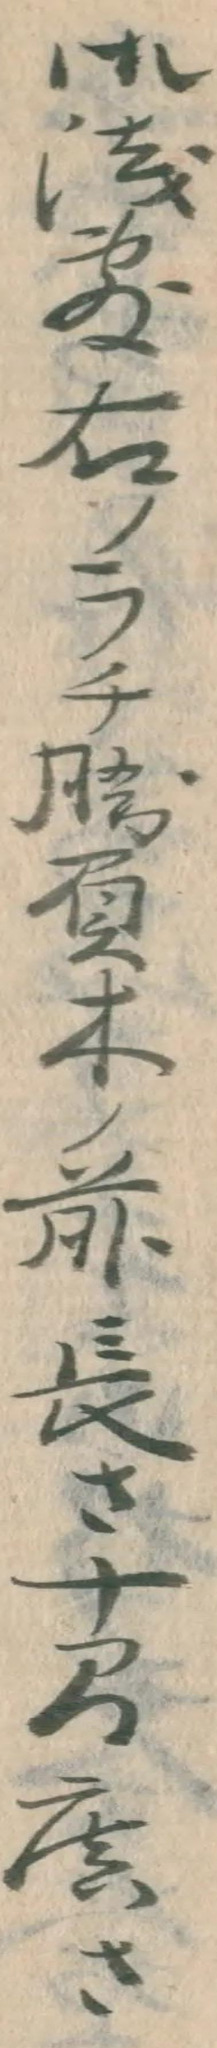御浅敷右ノラチ勝負木ノ前長さ十間広さ
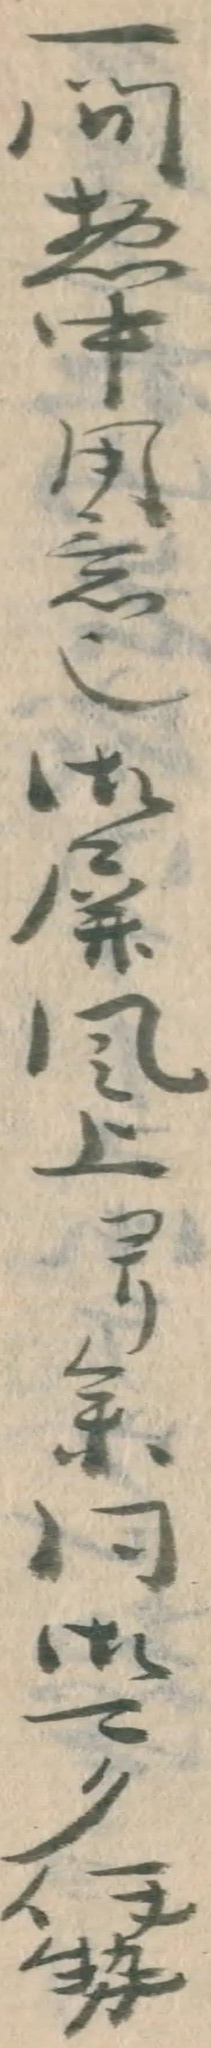一間惣中用意也御屏風上ヨリ参同御マク伊勢
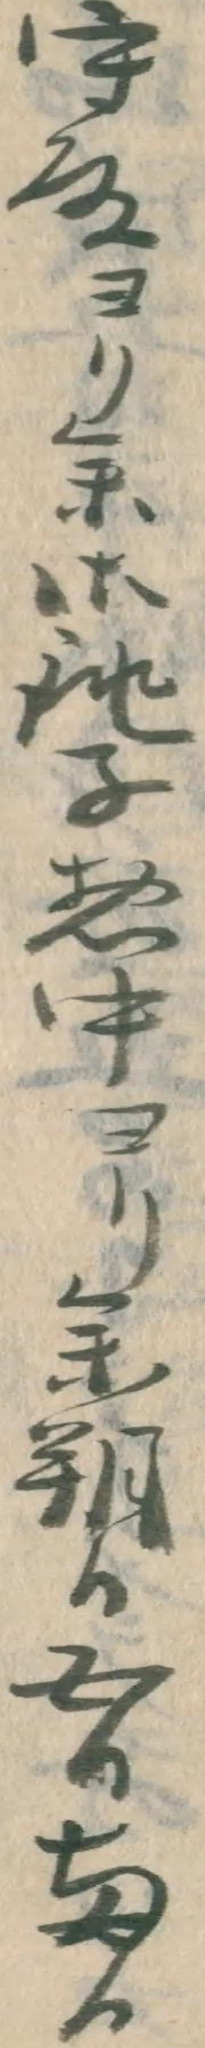守殿ヨリ参御銚子惣中ヨリ参朔日五日両日
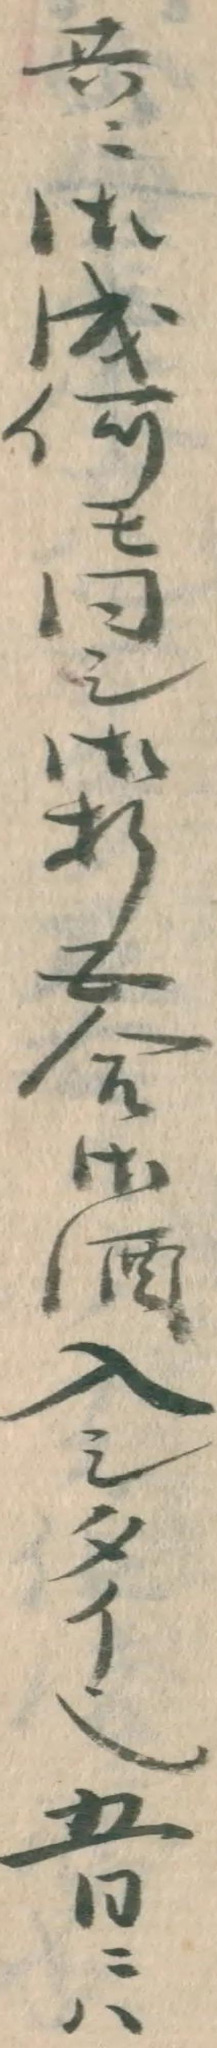共ニ御成何モ同シ御折五合御酒入シタイ也五日ニハ
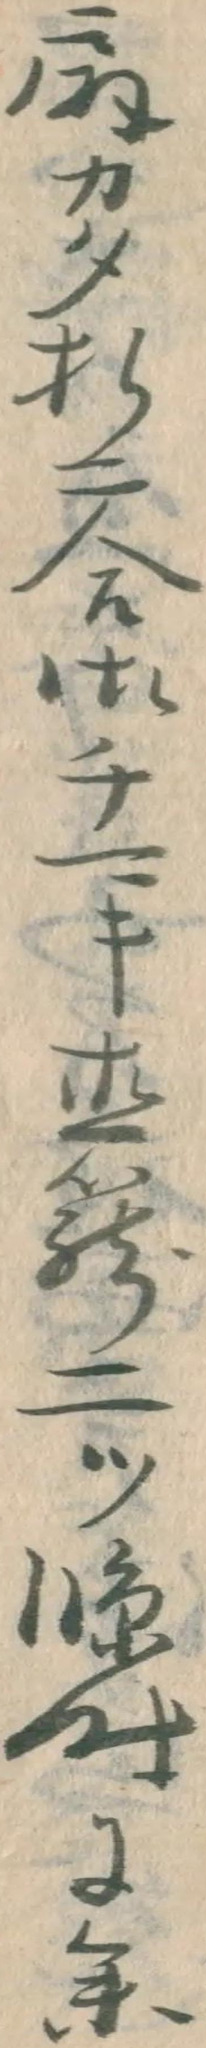扇カタ折二合御チマキ直籠二ツ臨時に参
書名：賀茂社記録. 第10冊
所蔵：国立国会図書館 National Diet Library, JAPAN
